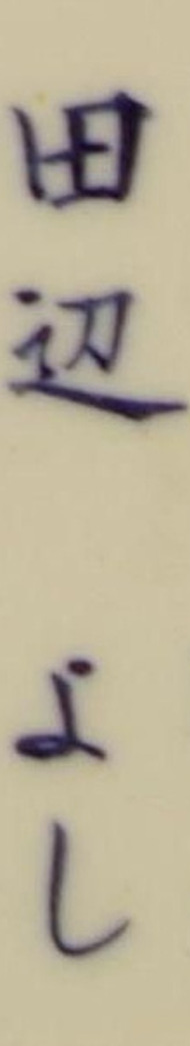田辺よし
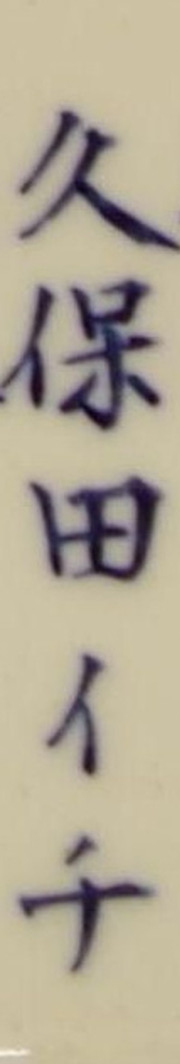久保田イチ
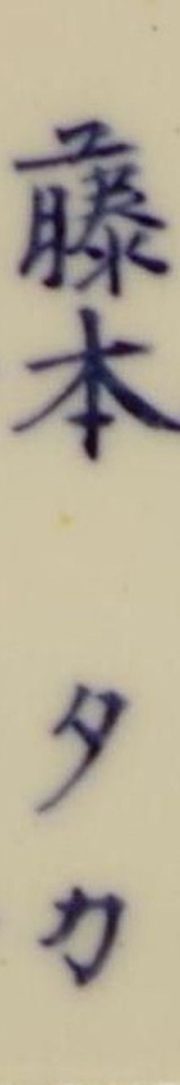藤本タカ
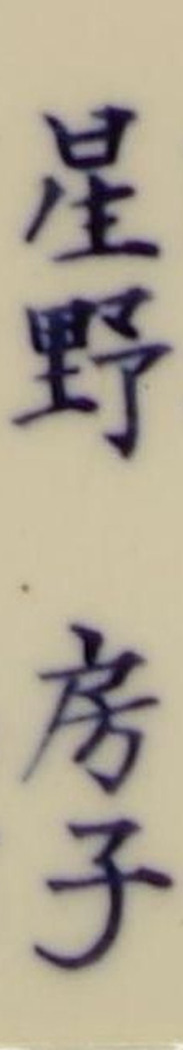星野房子
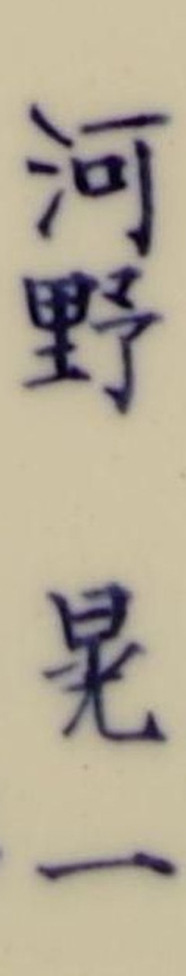河野晃一
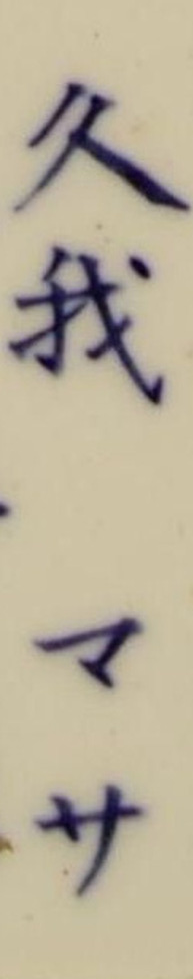久我マサ
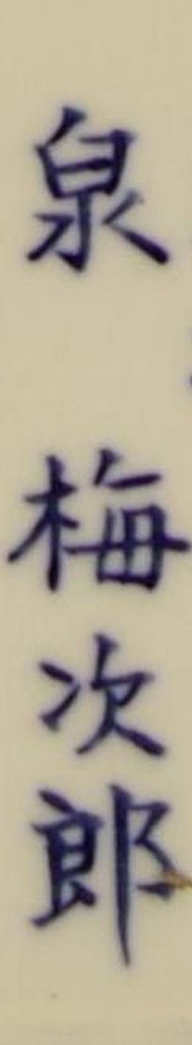泉梅次郎
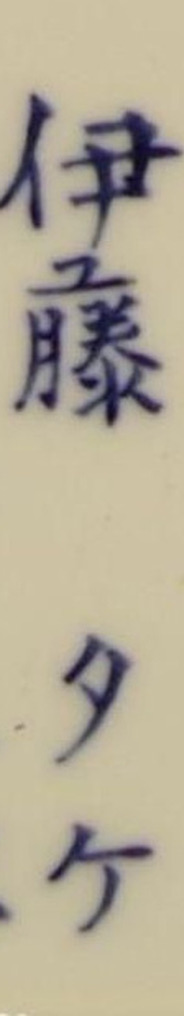伊藤夕ケ
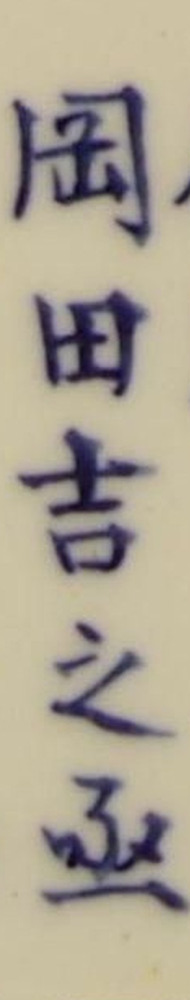岡田吉之丞
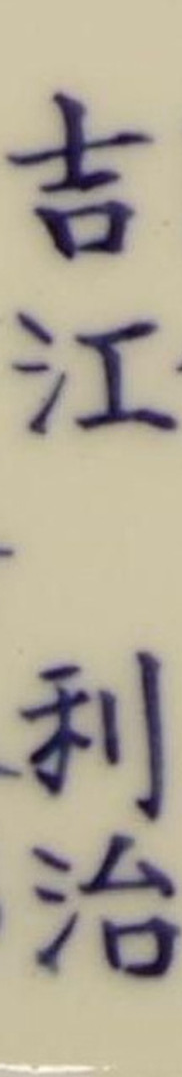吉江利治
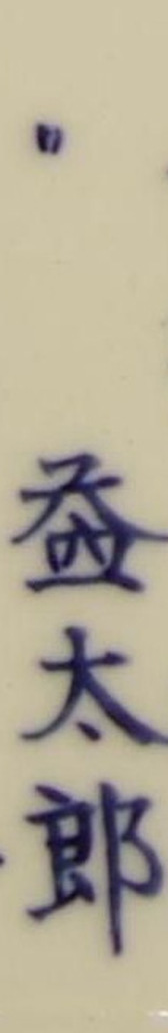益太郎
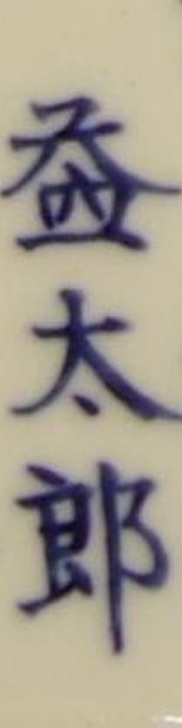益太郎
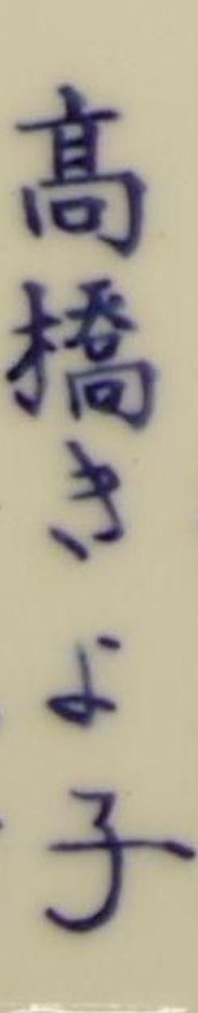高橋きよ子

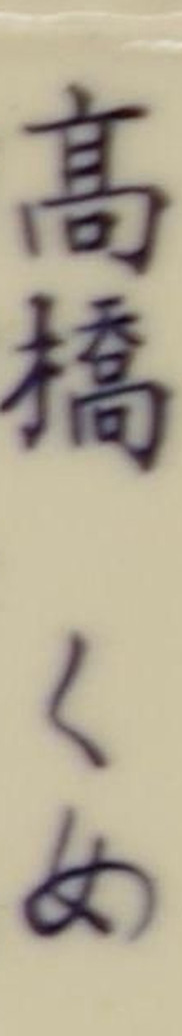高橋くめ
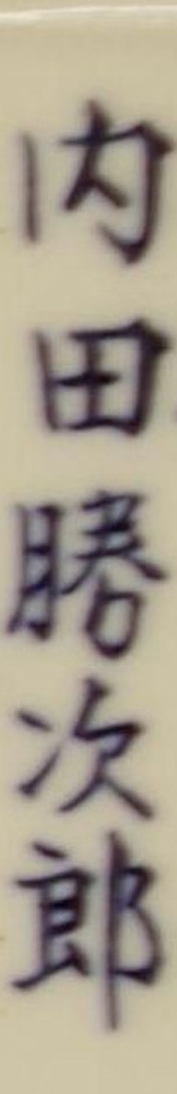内田勝次郎
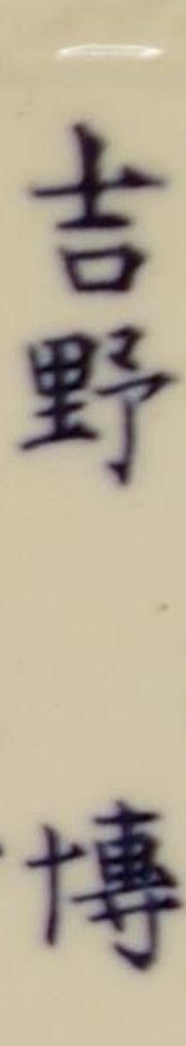吉野博
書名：E~L
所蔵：高野山金剛峯寺
